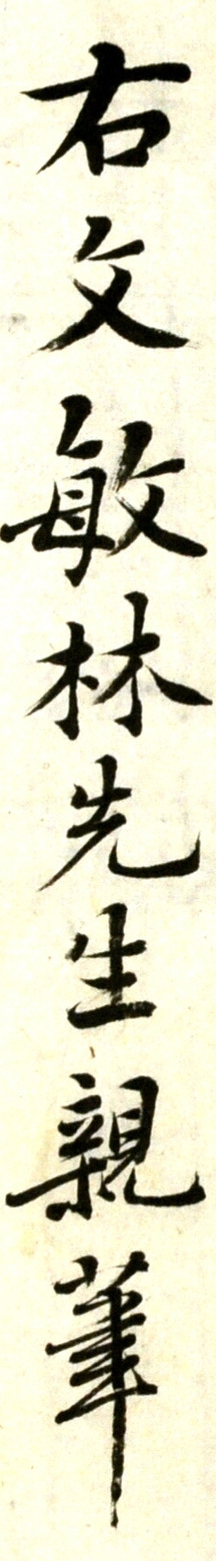右文敏林先生親筆
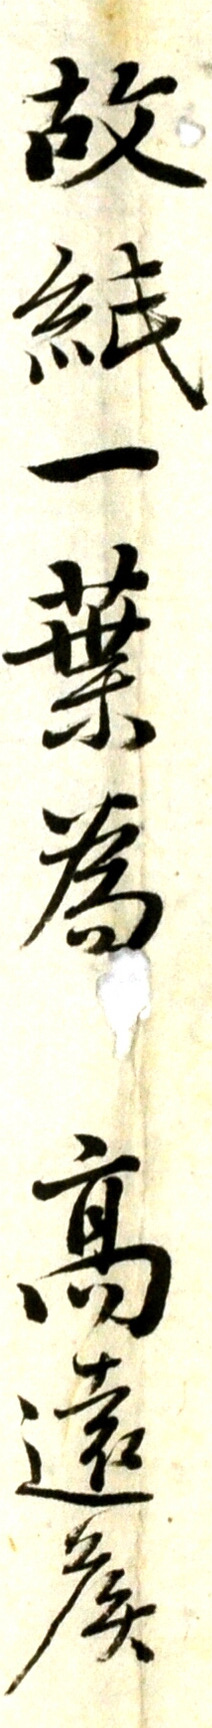故紙一葉為高遠侯
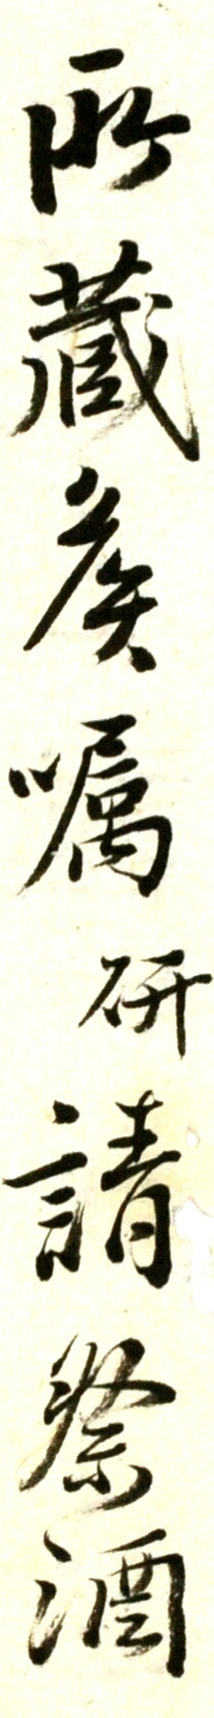所蔵侯属研請祭酒
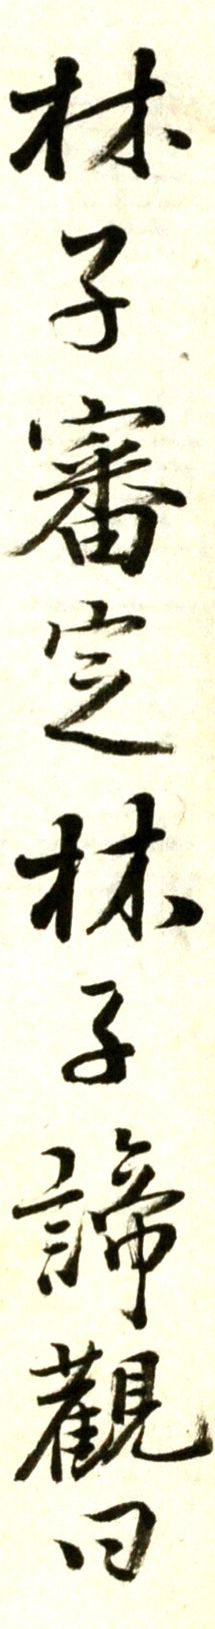林子審定林子諦観同
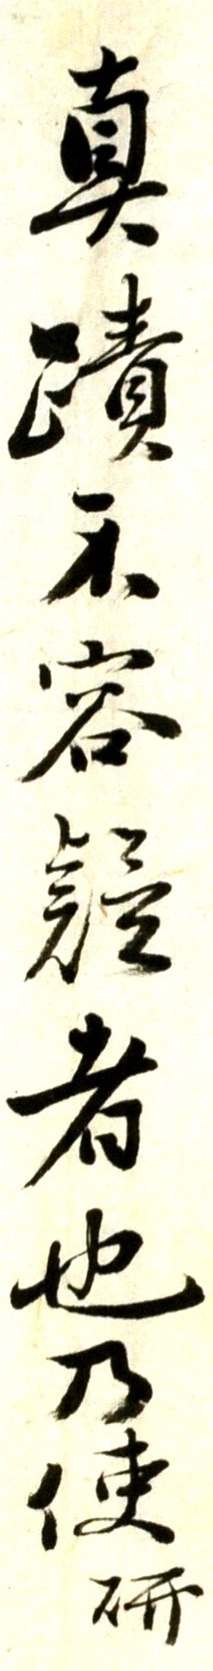真蹟不容疑者也乃使研
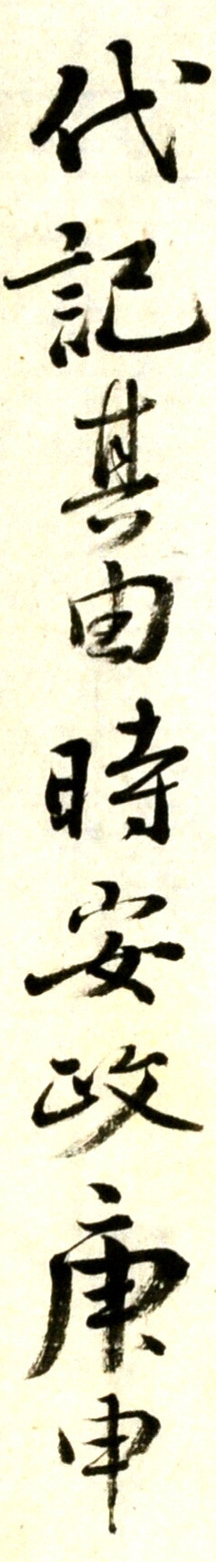代記其由時安政庚申
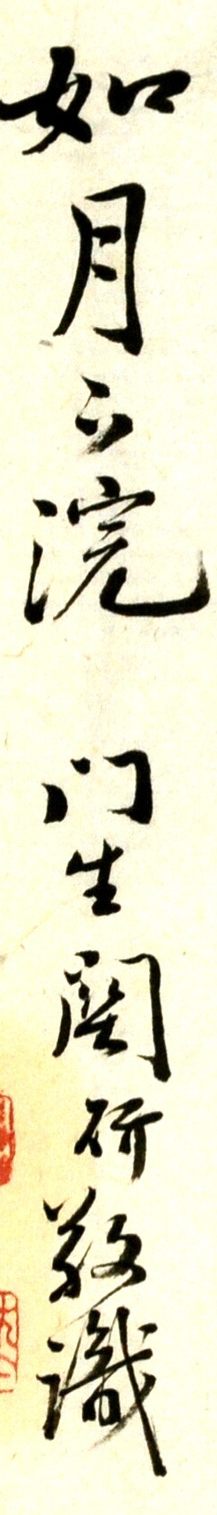如月下浣門生関研敬識
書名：掛軸
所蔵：伊那市立高遠町図書館・合同会社AMANE
